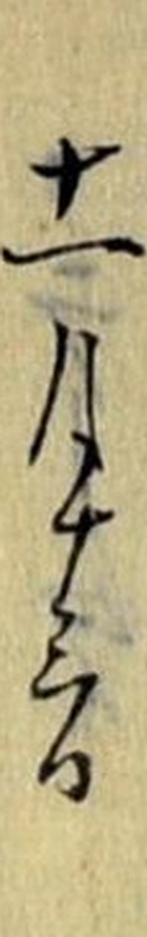十一月十三日
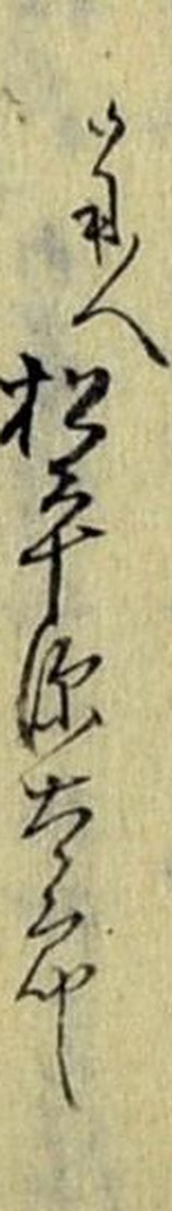御用人松平源太郎
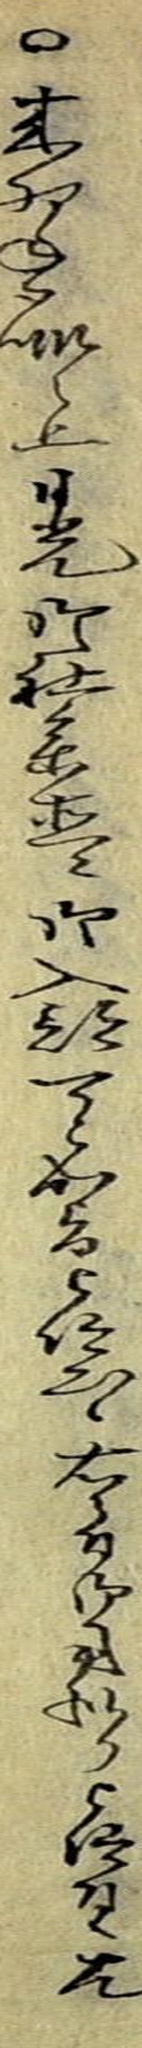○來卯年御暇之上日光御社参直々御入部可被成旨被仰出候右に付御用掛り被仰付候尤
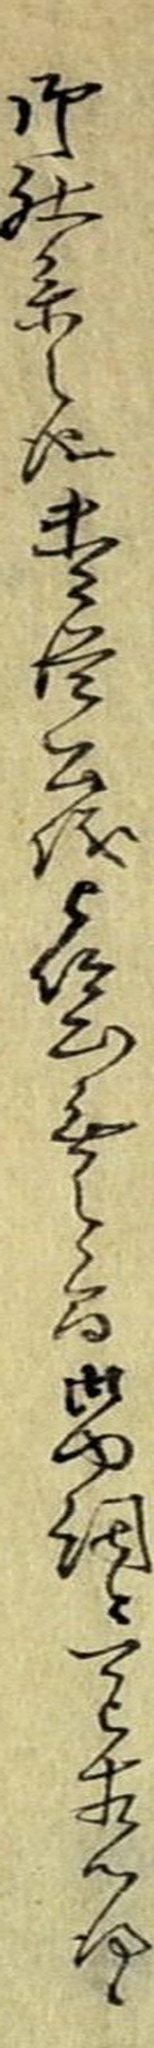御社参之儀未た従公儀被仰出無之候間御内調と可被相心得候
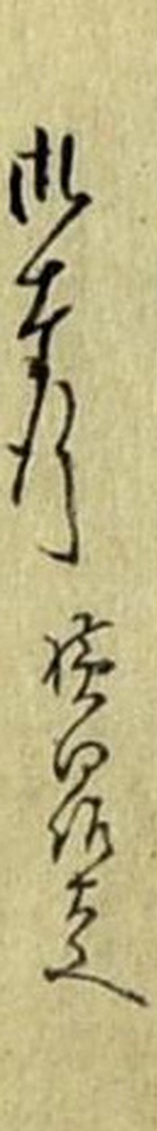御奉行横田作太夫
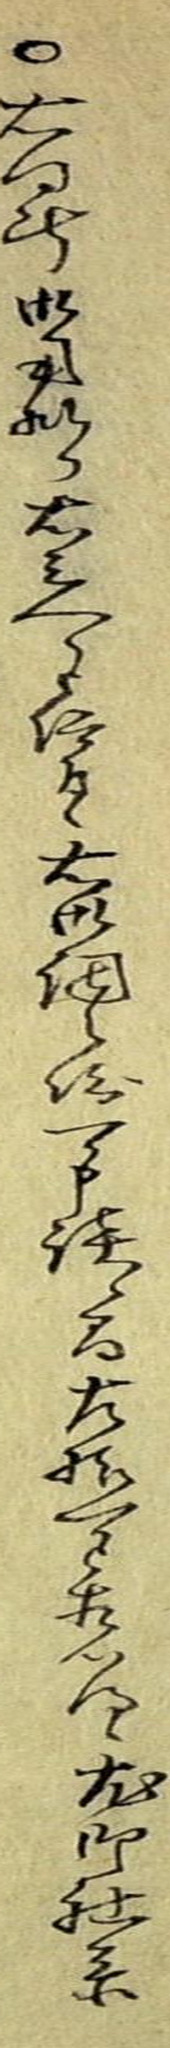○右同断御用掛り右三人被仰付候右御調之儀可申談候間左様可被相心得候尤御社参
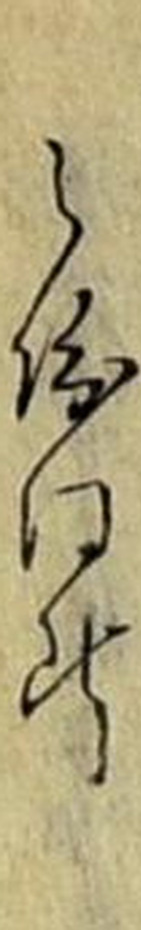之儀同断
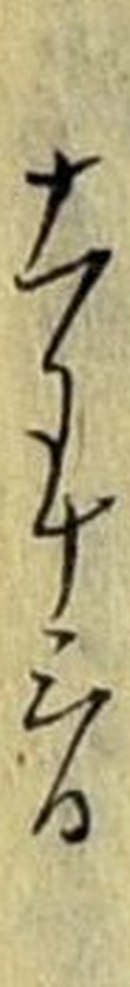十一月十三日

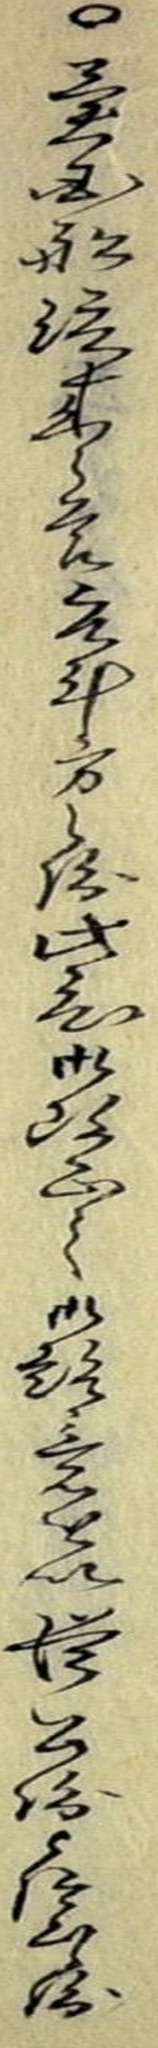○異国船渡来之節取斗方之儀此度御改正之御趣意を以従公儀被仰出候儀
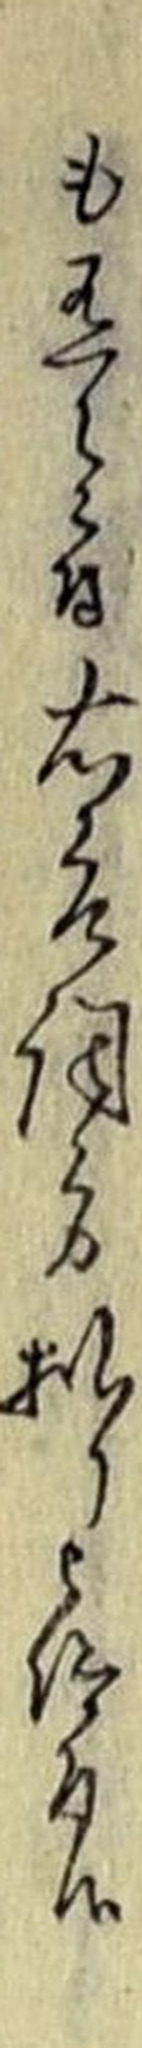も有之候に付右取調方掛り被仰付候
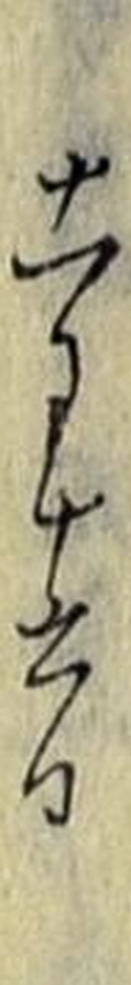十一月十六日
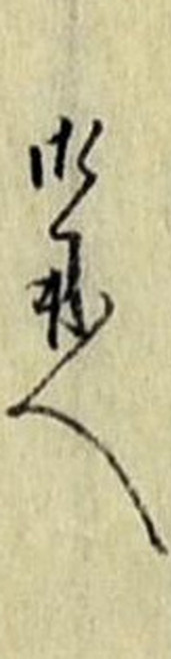御用人
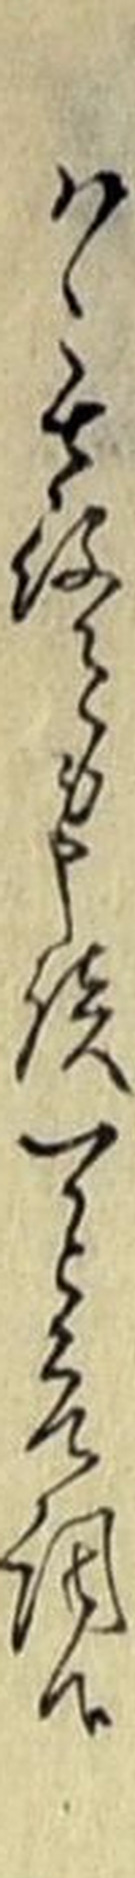はヽ其役々へも申談可被取調候
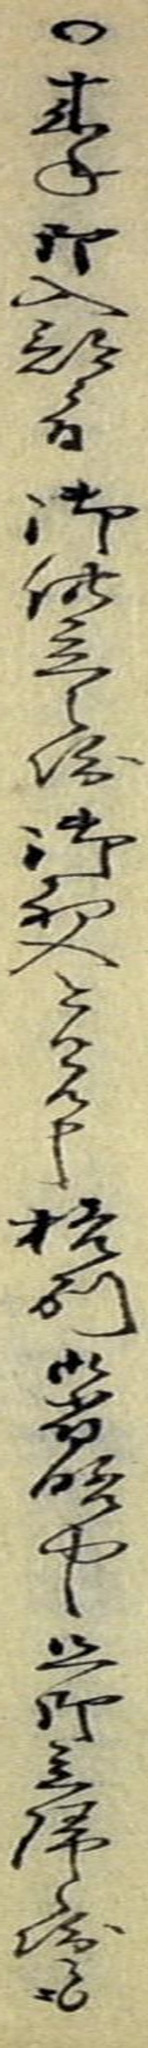○来年御入部に付御供立之儀御初入とは乍申各別御省略中且御立帰之儀にも
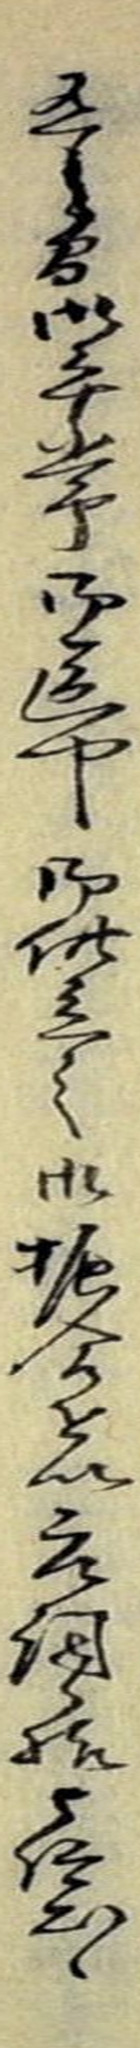有之候間御平常御道中御供立之御振合を以取調候様被仰出候
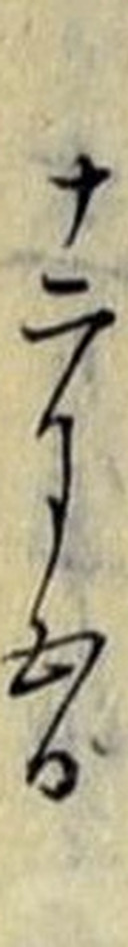十二月五日
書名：命令之部 六
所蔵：福井県文書館 Fukui Prefectural Archives
